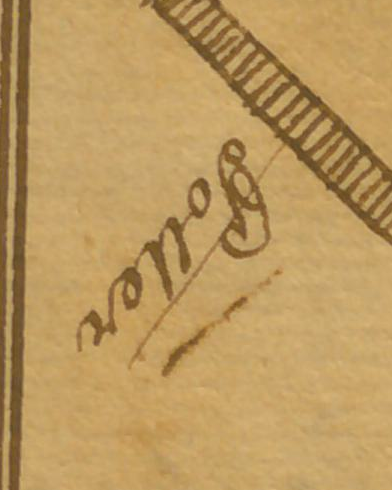Potter
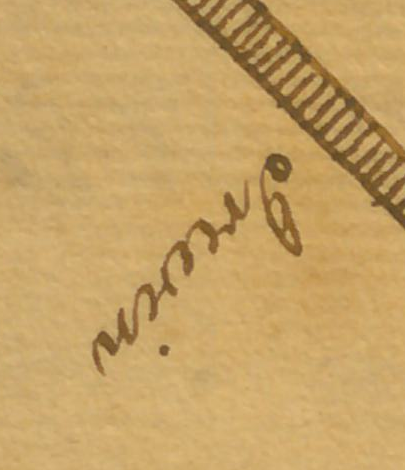Irwin
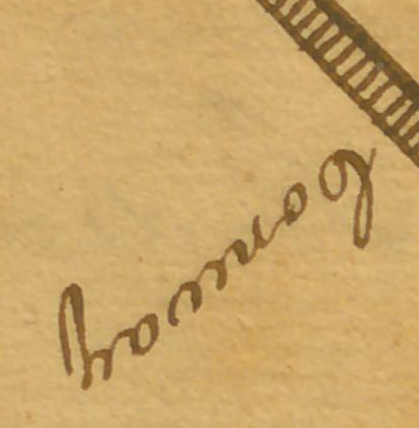Conway
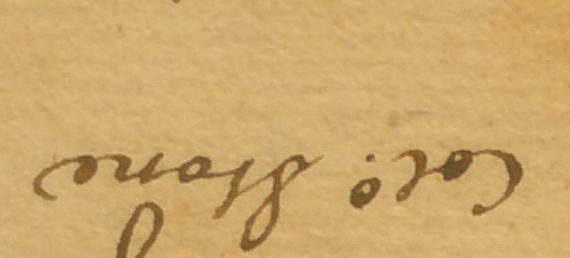Col^o. Stone
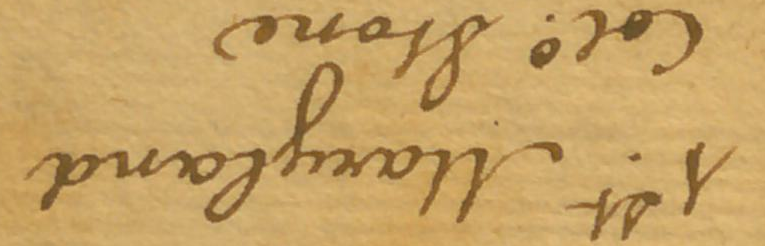1^st. Maryland
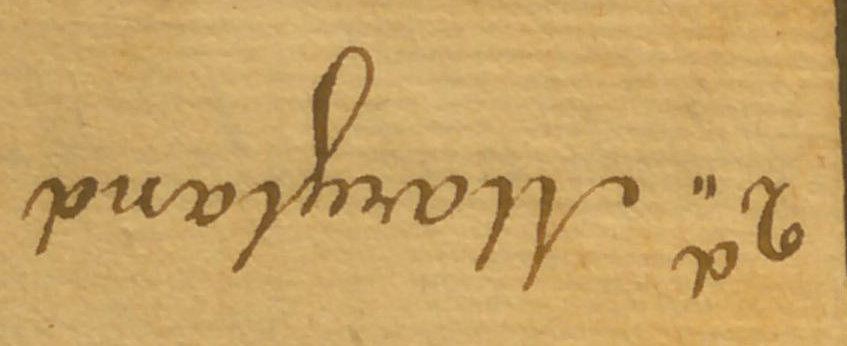2^nd. Maryland
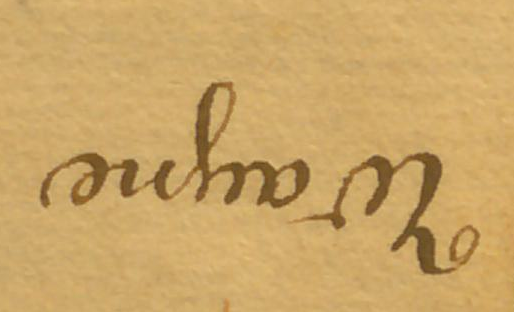Wayne
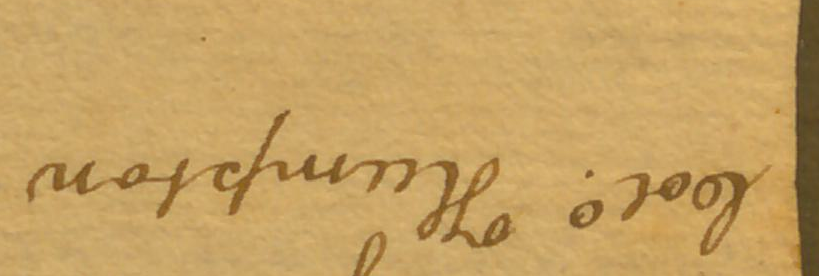Col^o. Humpton
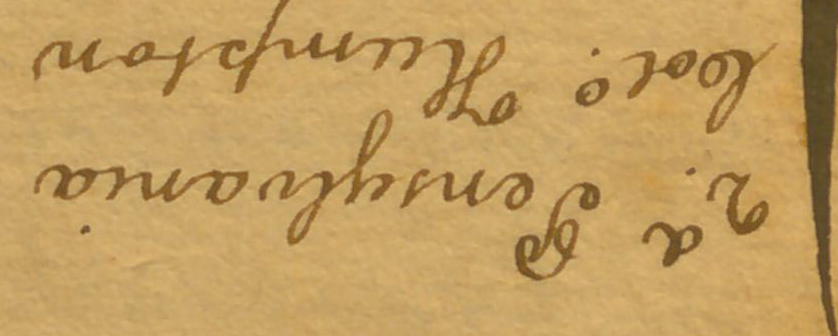2^d. Pensylvania
